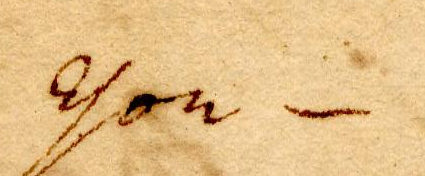You-
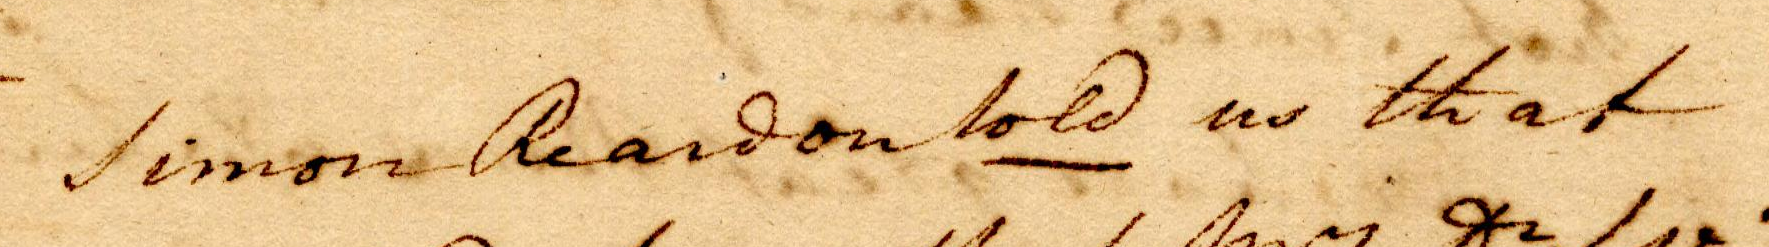Simon Reardon told us that
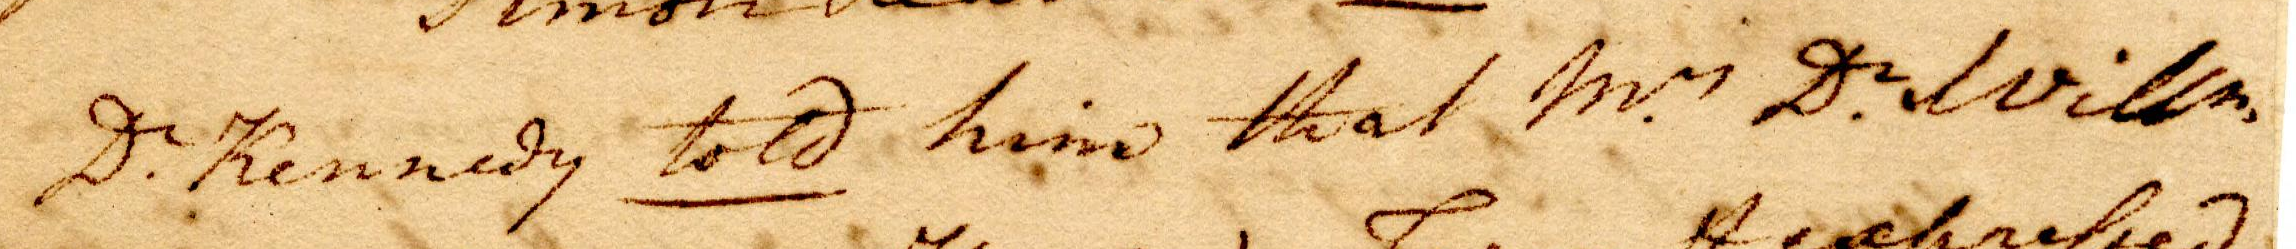D^r. Kennedy told him that M^rs. D^r. Will^m.
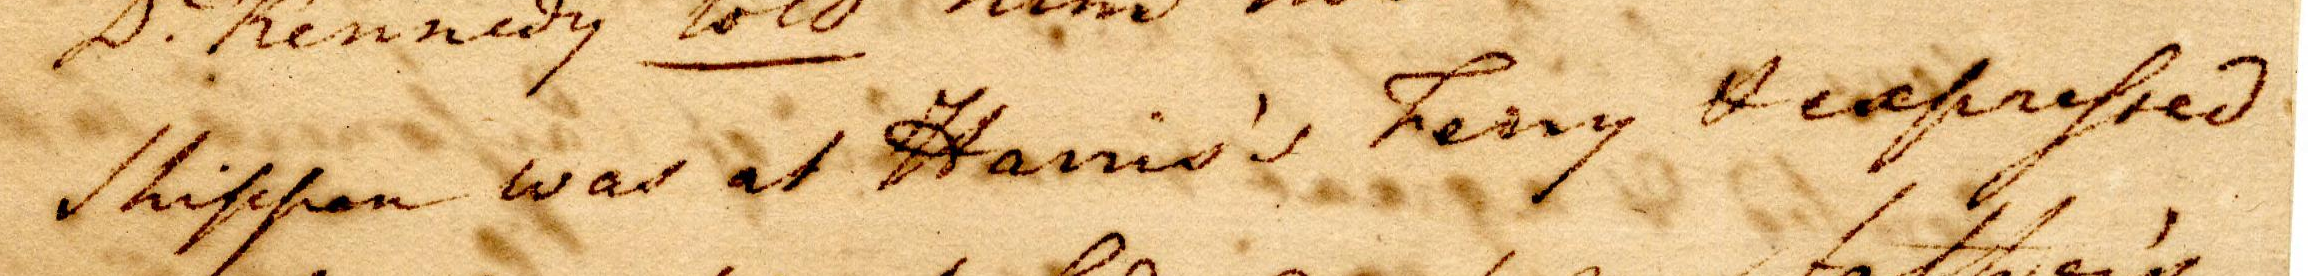Shippen was at Harris's Ferry & expressed
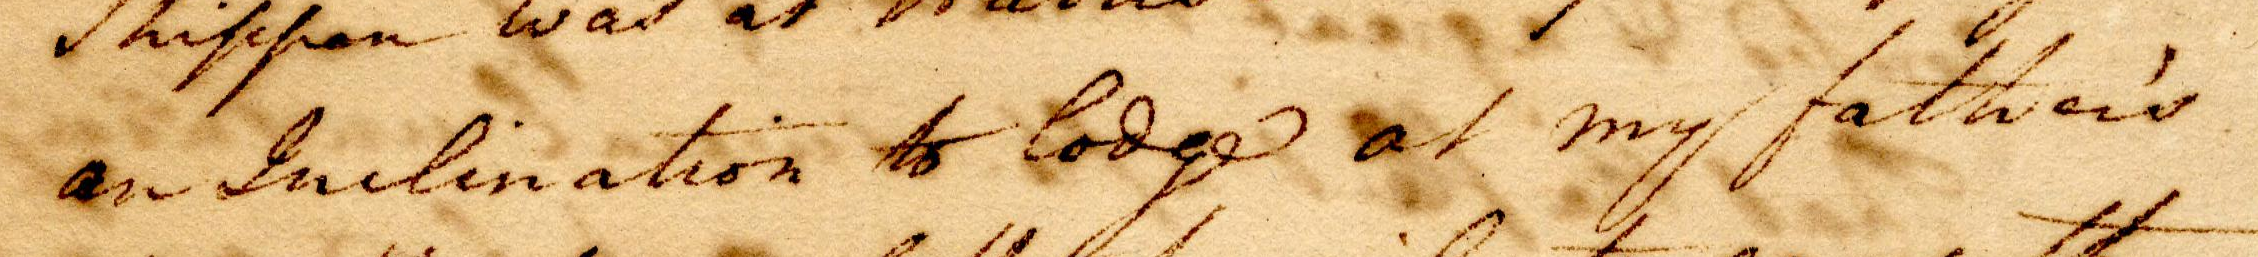an Inclination to lodge at my father's
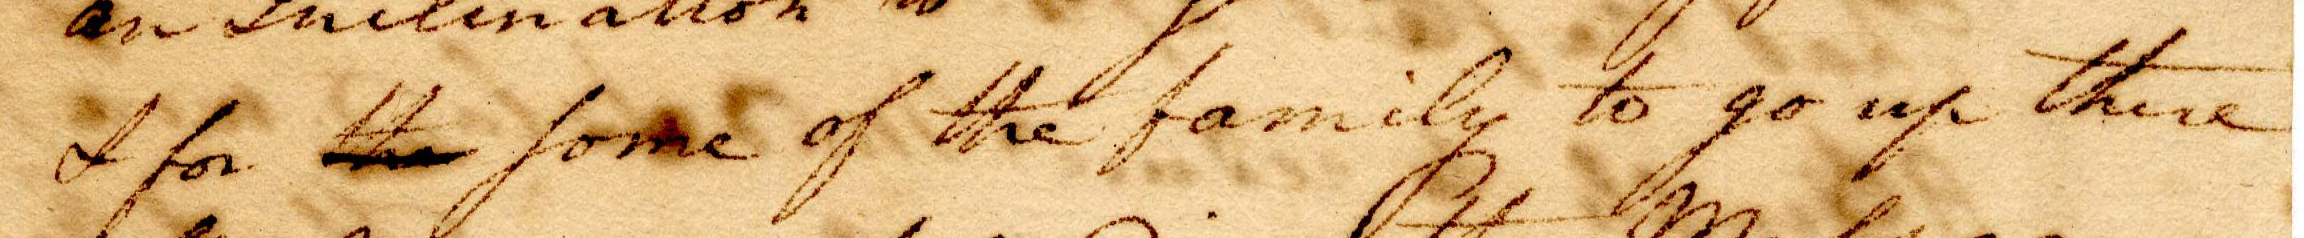& for the some of the family to go up there
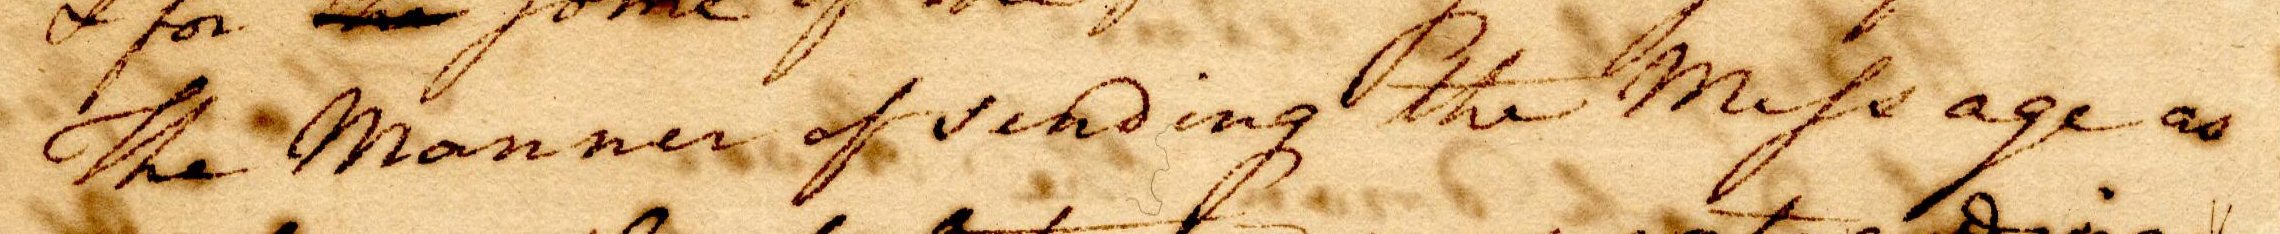The Manner of sending the Message as
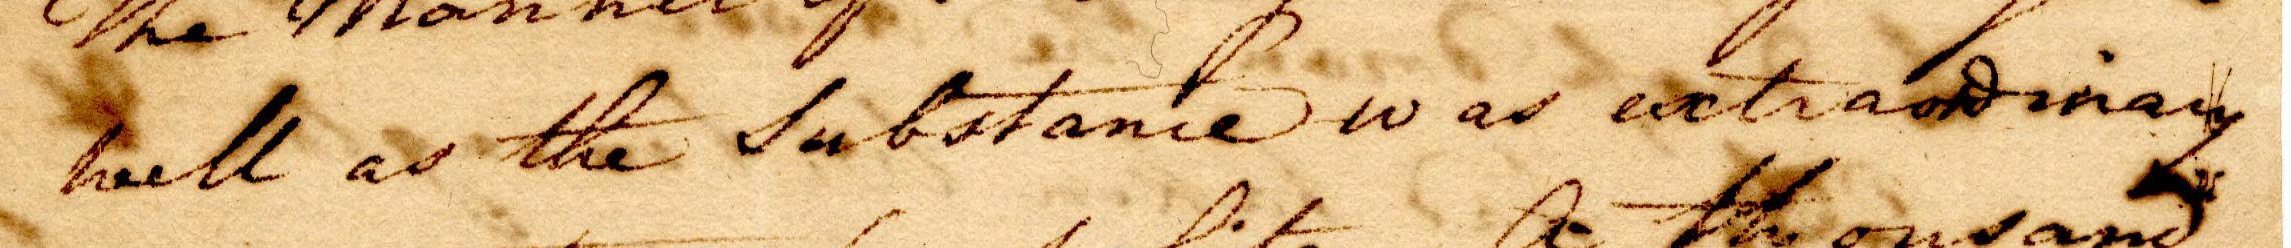well as the substance was extraordinary
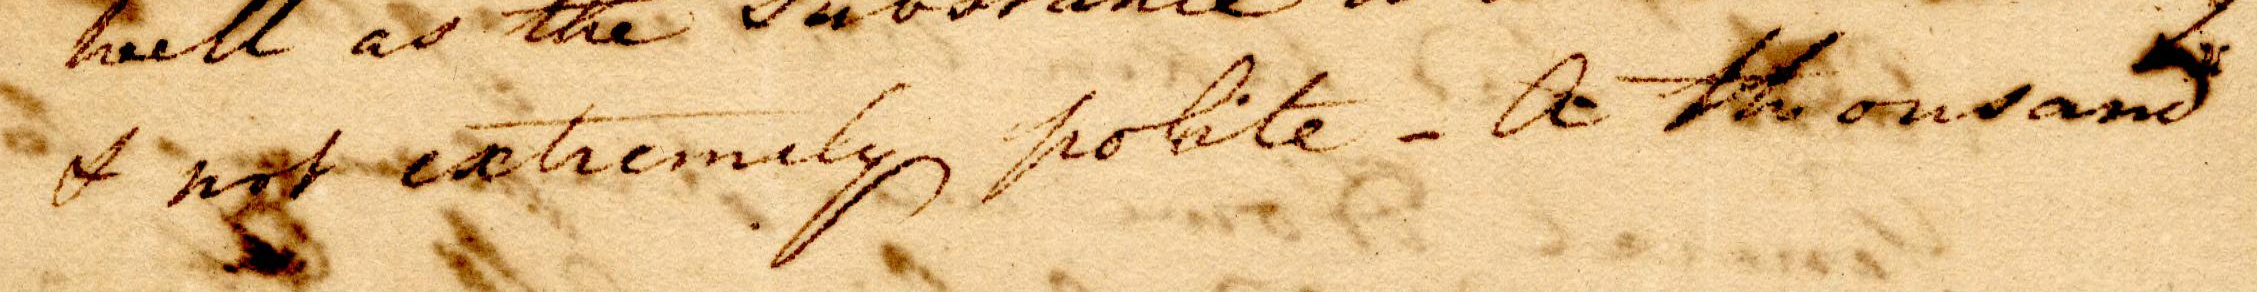& not extremely polite- A thousand
